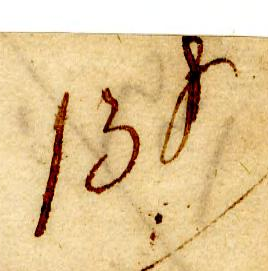138
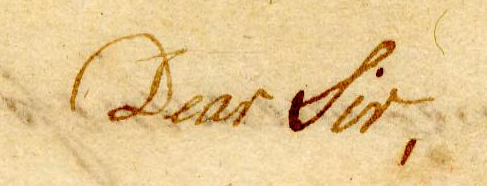Dear Sir,
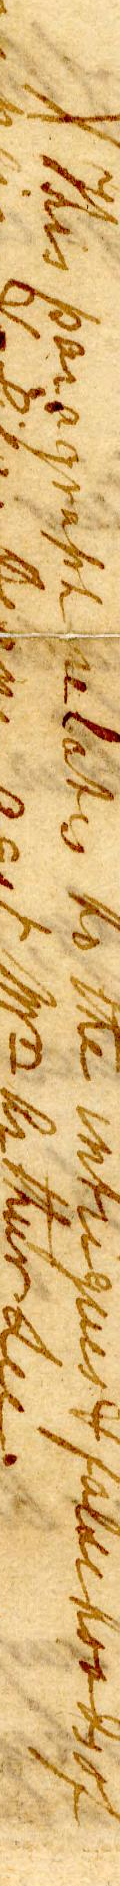X This paragraph relates to the intrigues & false hands of
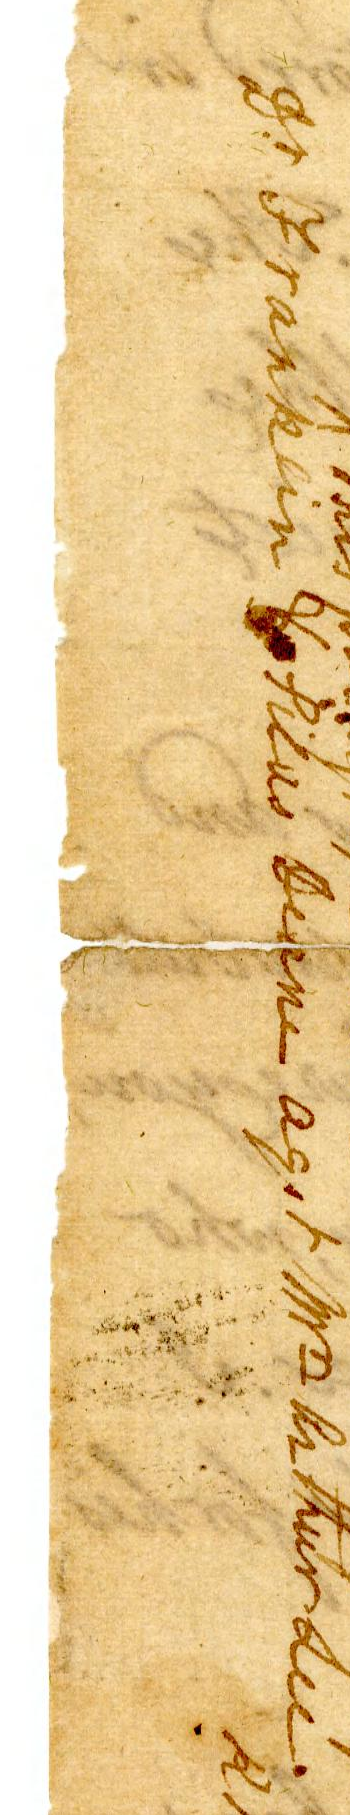D^r Franklin & Silas Deane ag^t. M^r Arthur Lee
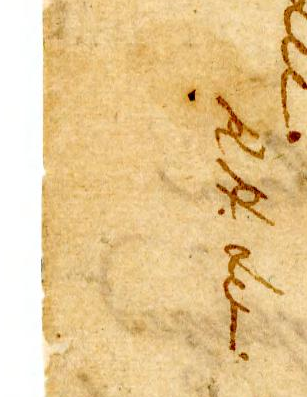RH. Lee
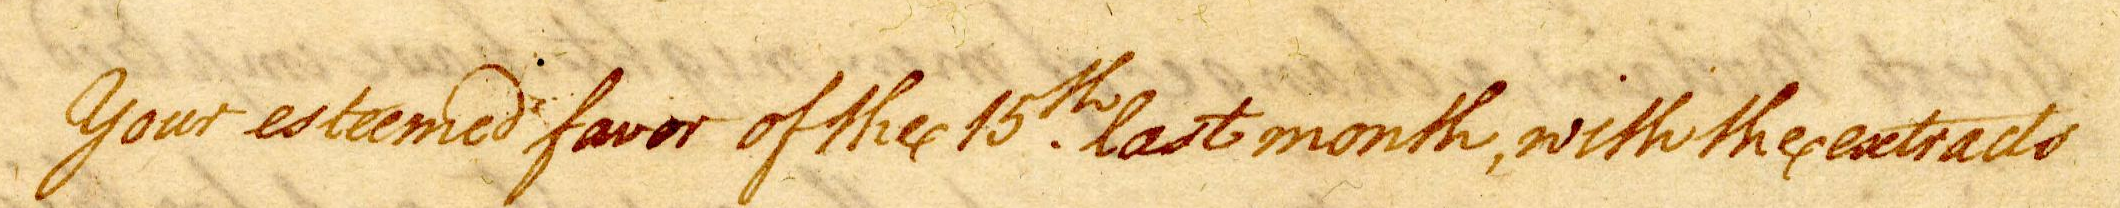Your esteemed favor of the 10^th. Last. month, with the extracts
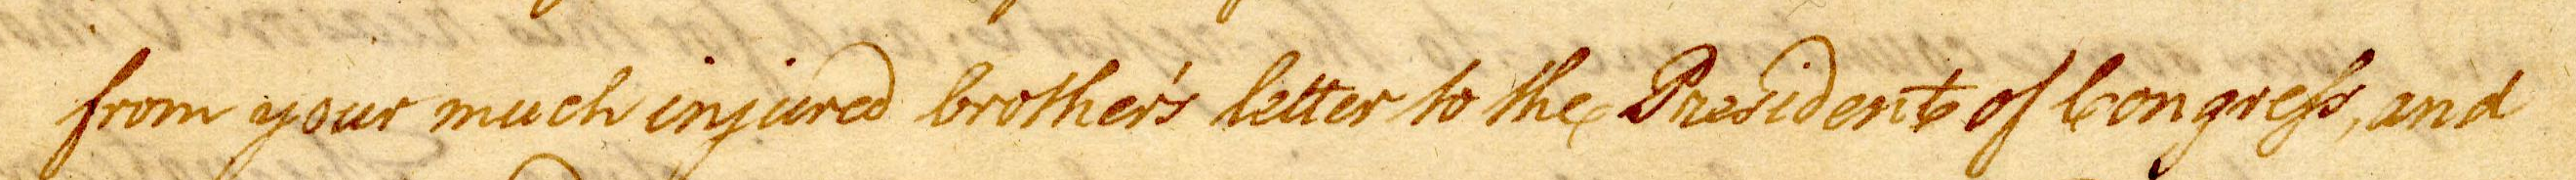from your much injured brother's letter to the President of Congress, and
